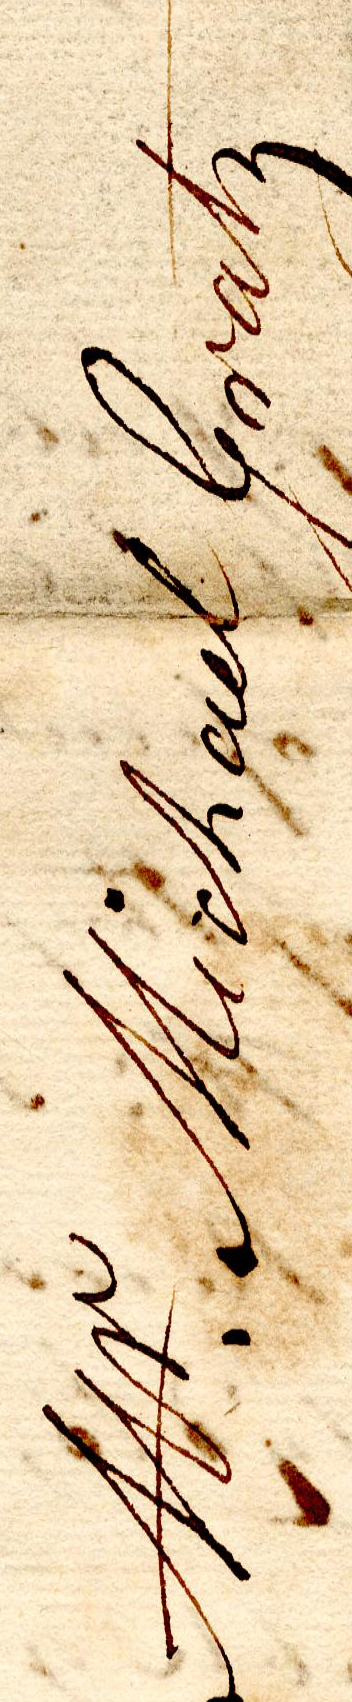M^r Michael Gratz
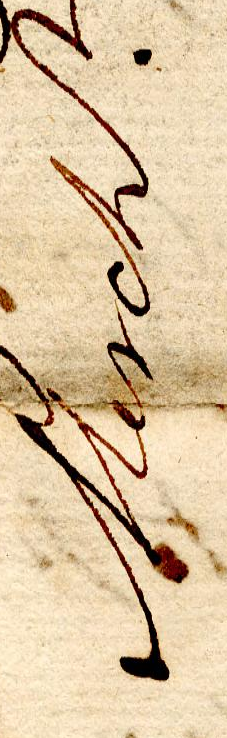Merch^t
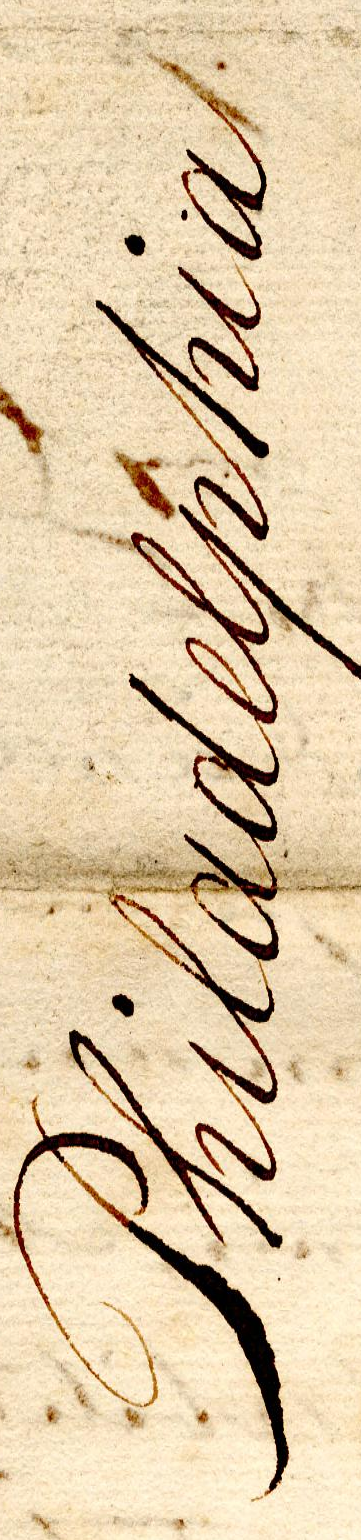Philadelphia
